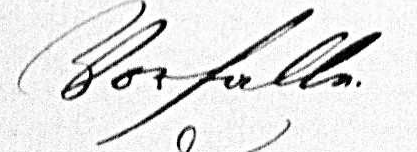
Vorfalle.
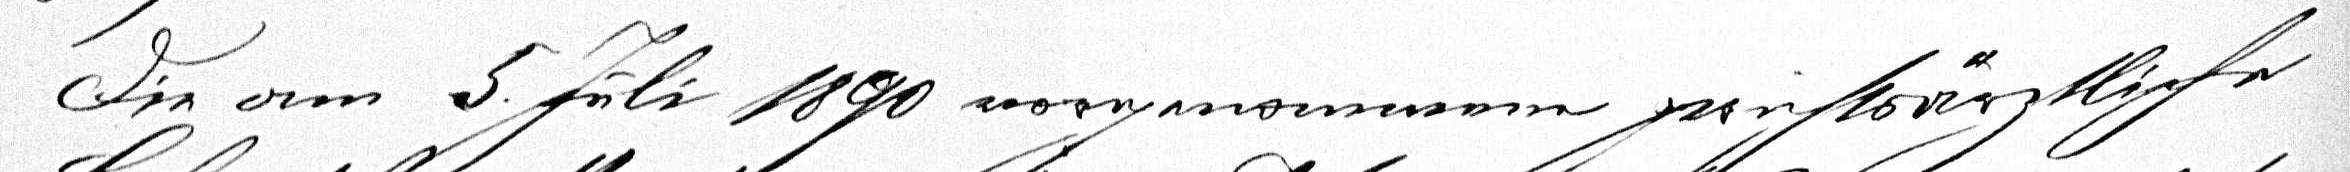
Die am 5. Juli 1890 vorgenommenen gerichtsärztliche
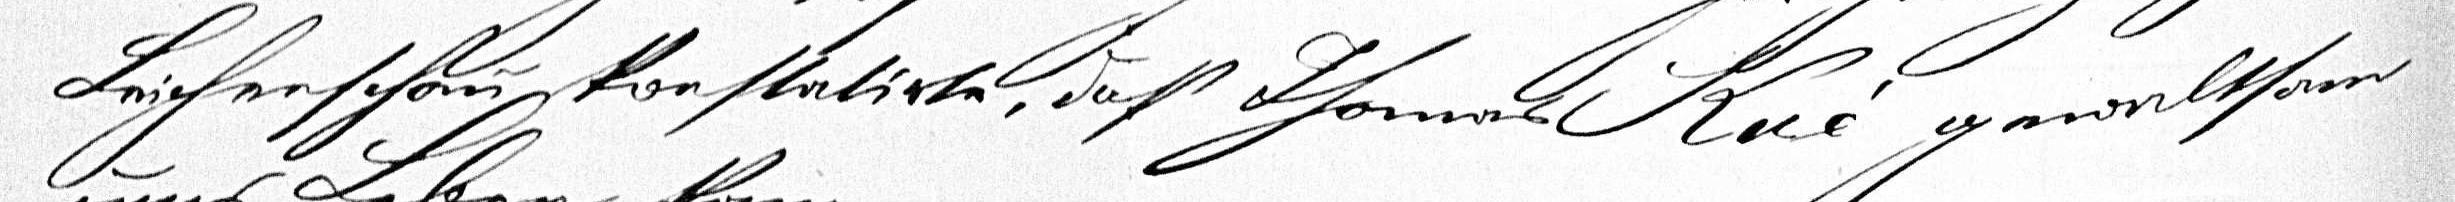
Leichenschau konstatirte, daß Thomas Kuć gewaltsam
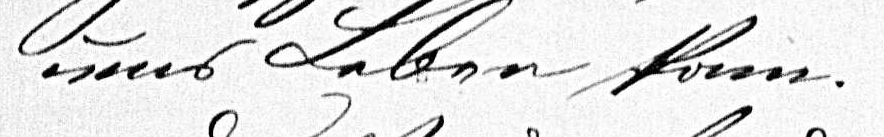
ums Leben kam.
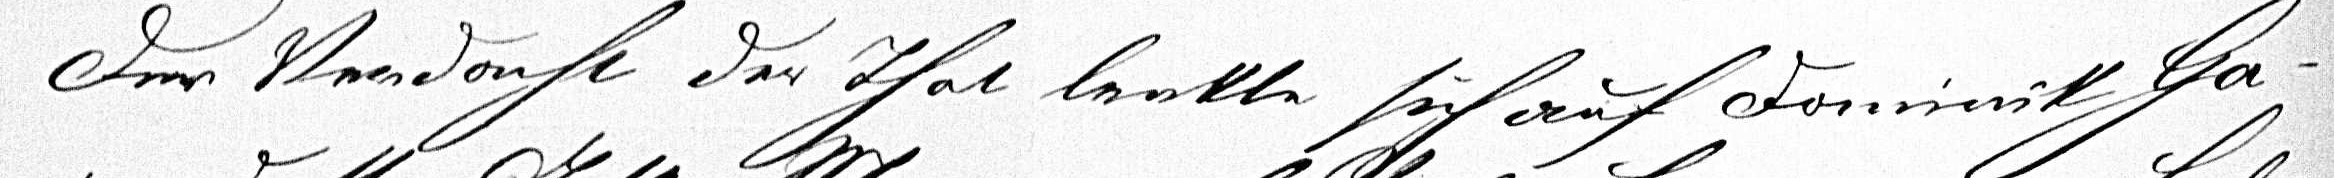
Der Verdacht der That lenkte sich auf Dominik Ga¬
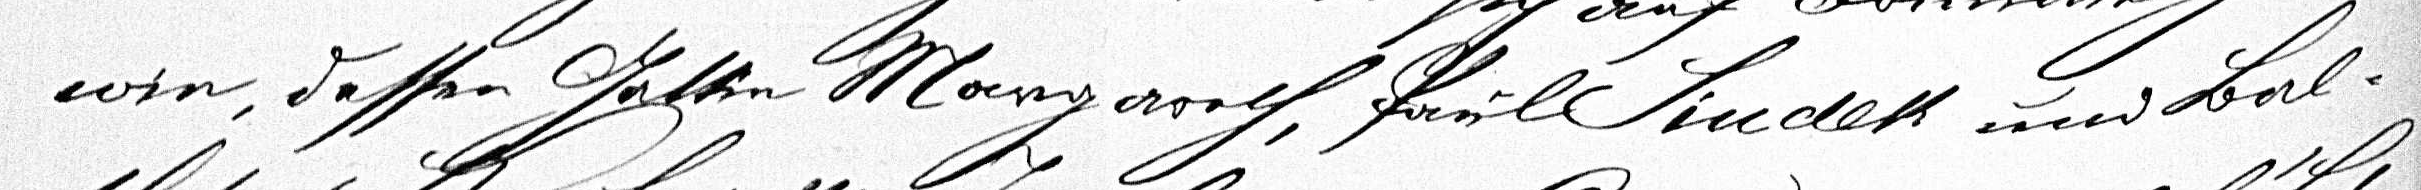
win, dessen Gattin Margareth, Paul Sindek und Bal¬
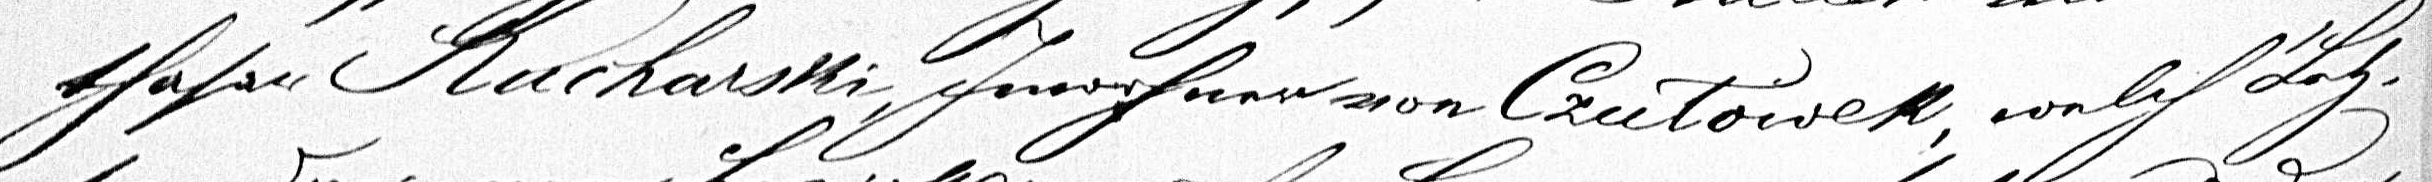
thaser Kucharski, Jewohner von Czułowek, welch Letz¬
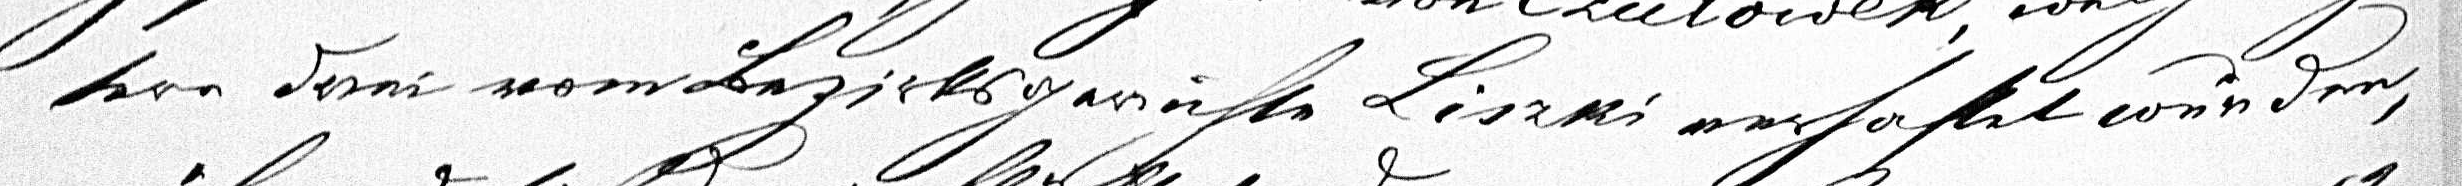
tere drei vom Bezirksgerichte Liszki verhaftet wurden,
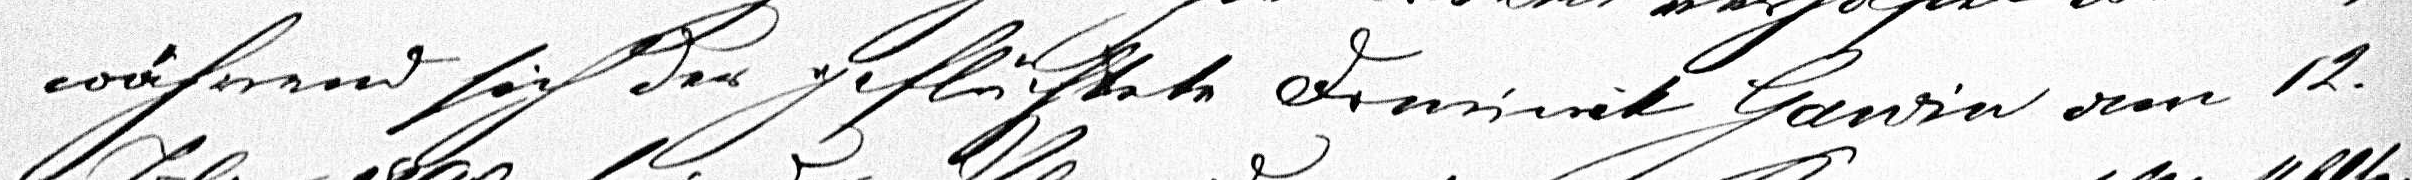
während sich der geflüchtete Dominik Gawin am 12.
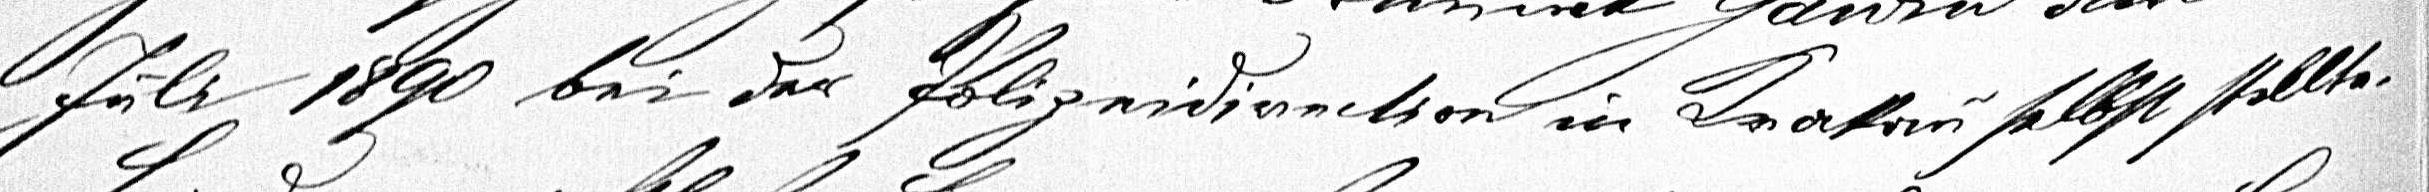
Juli 1890 bei der Polizeigdirection in Krakau selbst stellte.
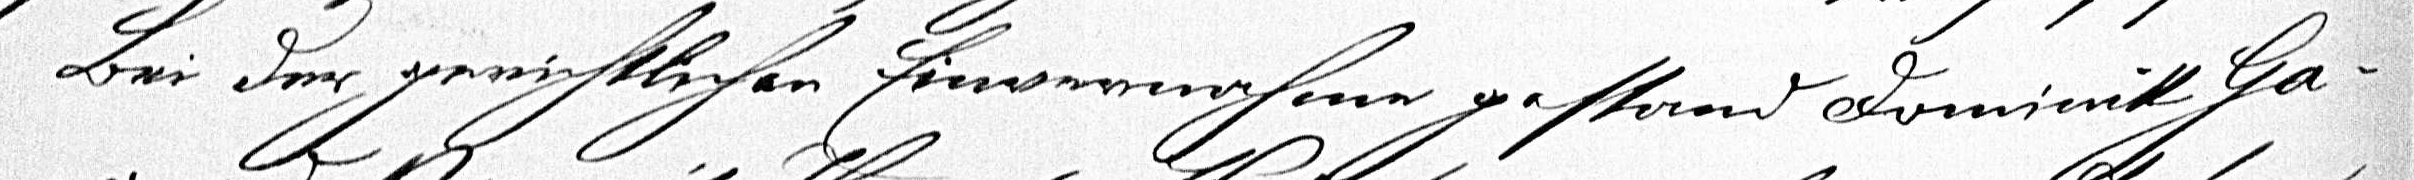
Bei der gerichtlichen Einvernehmung gestand Dominik Ga¬
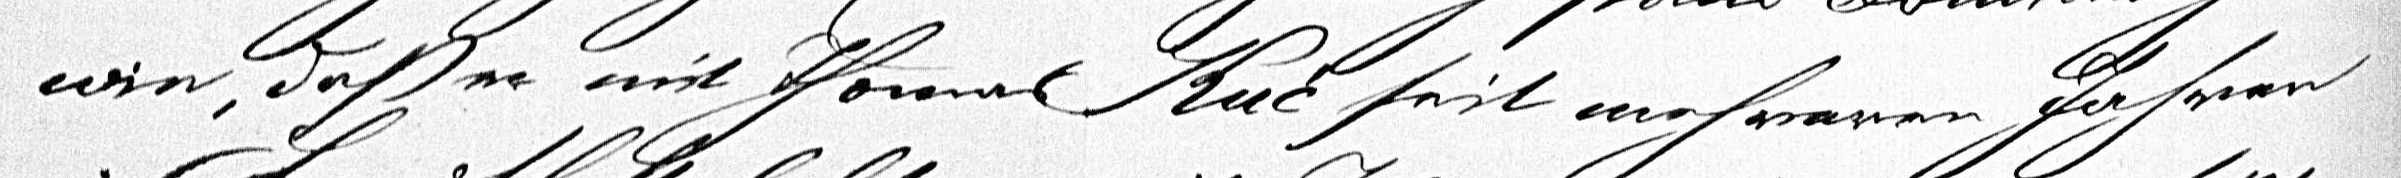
win, daß er mit Thomas Kuć seit mehreren Jahren
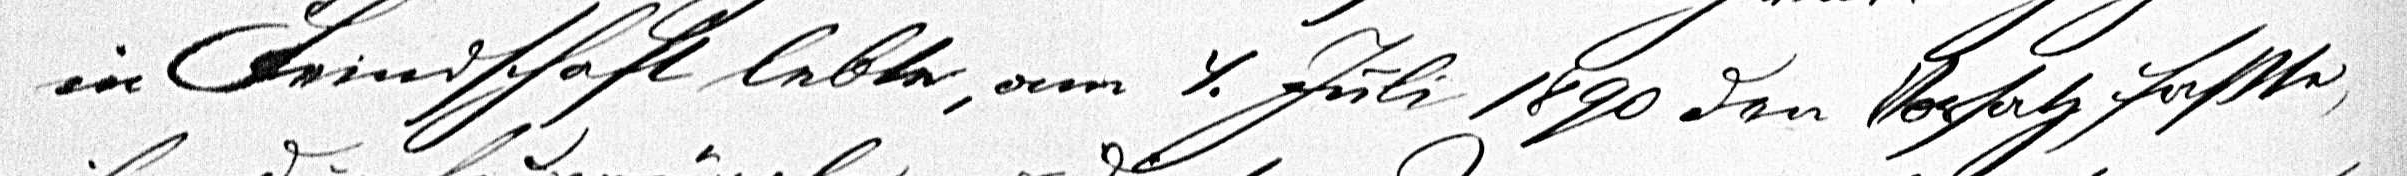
in Feindschaft lebte, am 4. Juli 1890 den Vorsatz faßte,
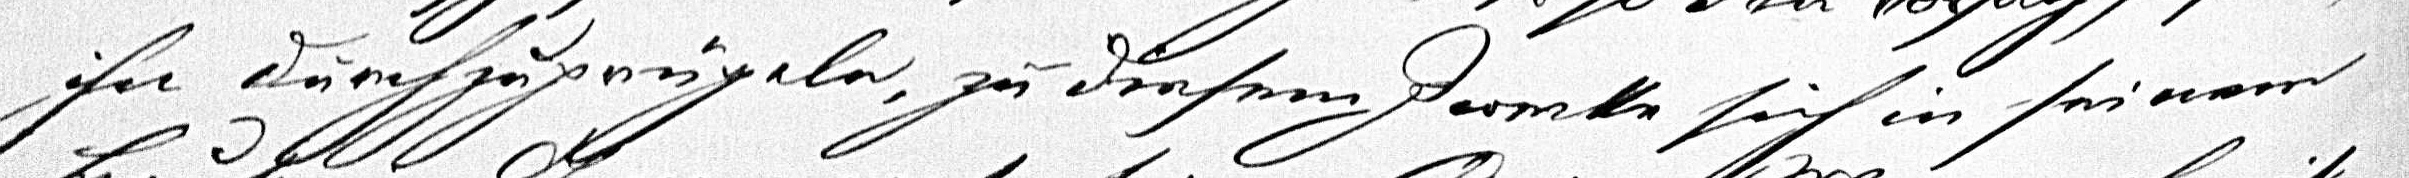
ihn durchzuprügeln, zu diesem Zwecke sich in seinem
